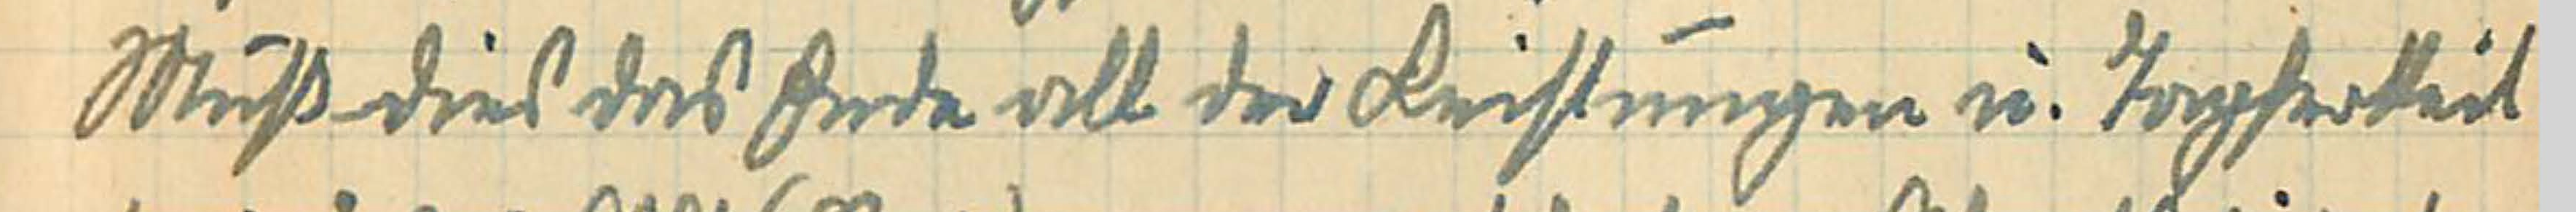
sein? Ein Oblt (Roch) war auch dabei. Abends sicherten
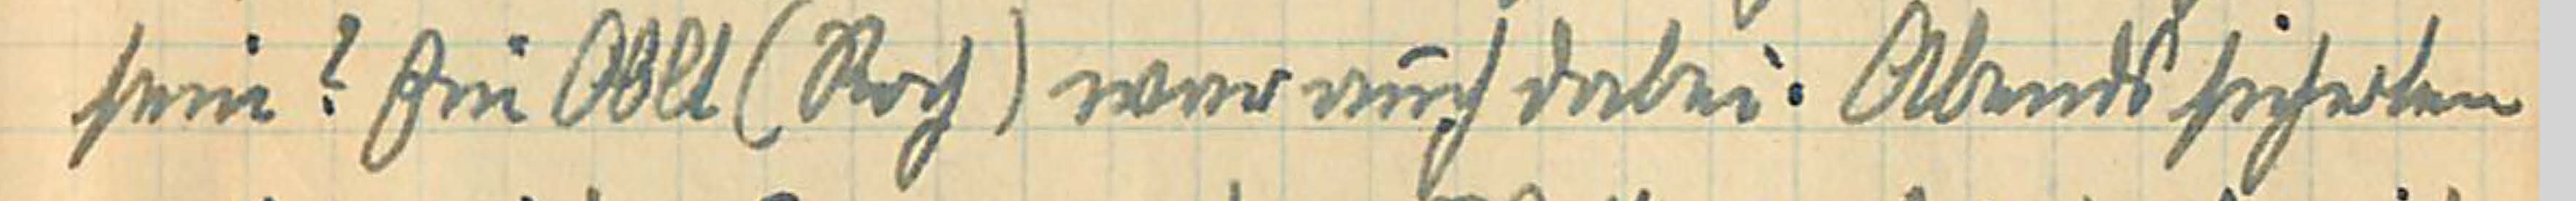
wir wiederum gegen den Wald zu. Ein Dorf mit
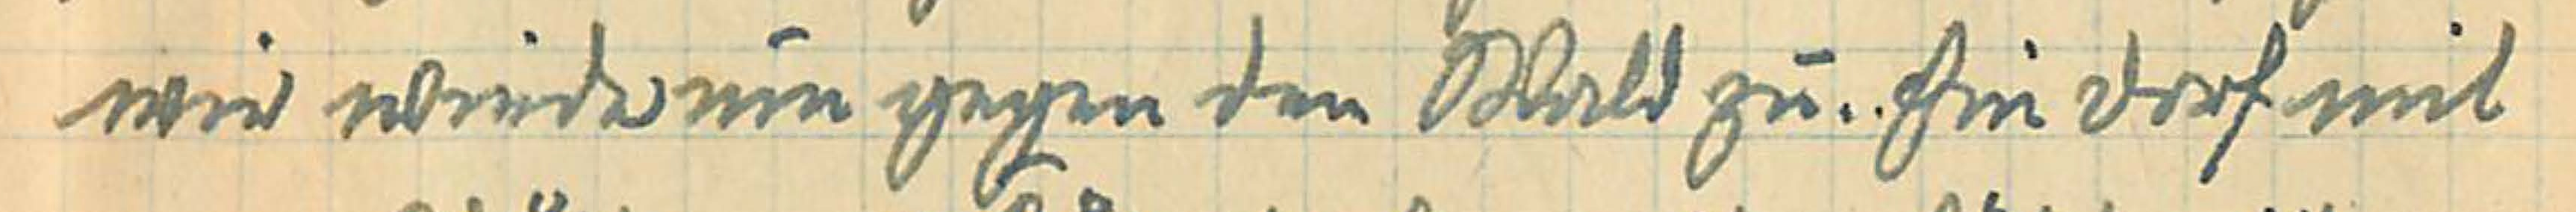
einer Mulde mit Kuscheln bewachsen läßt nicht gera-
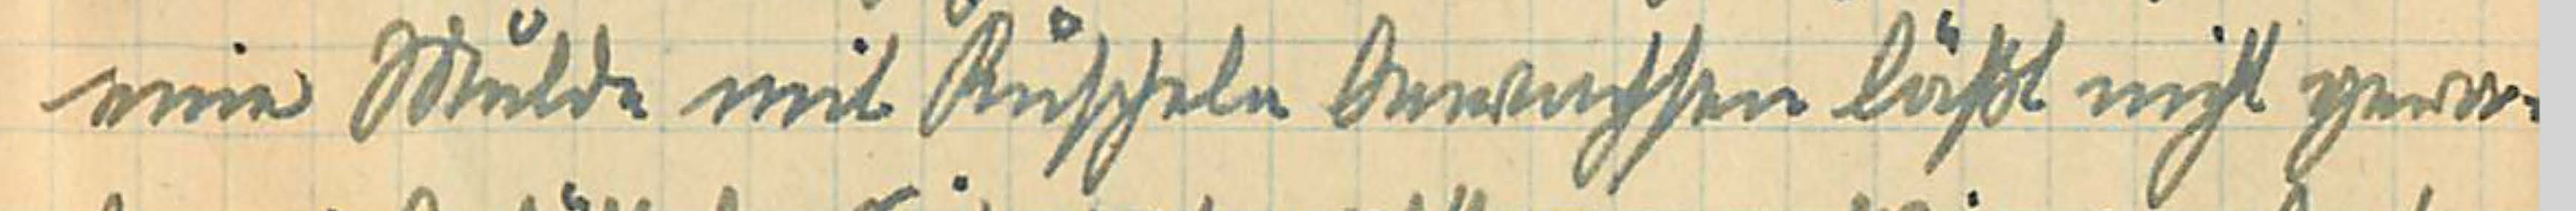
de ein Gefühl der Sicherheit aufkommen. Pioniere legten
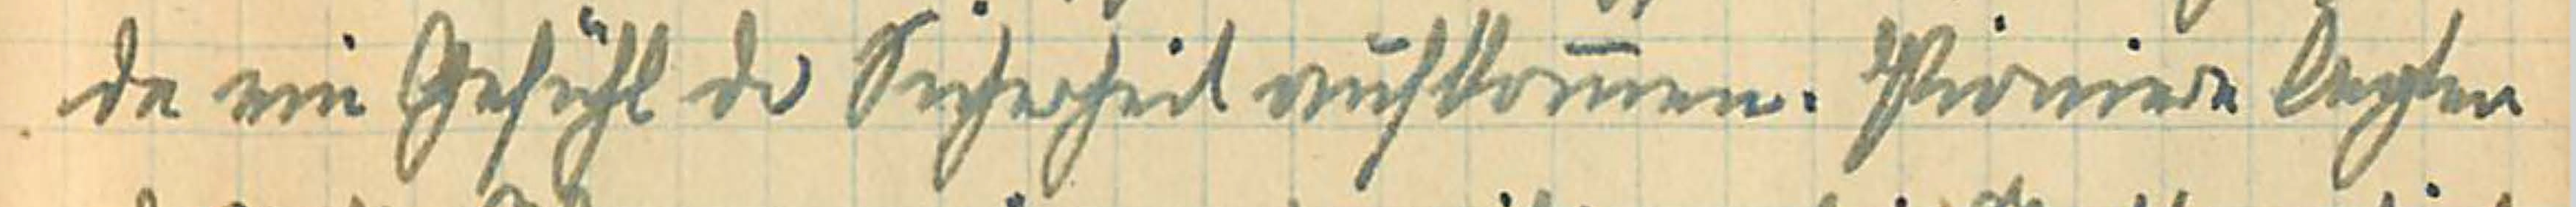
deshalb Alarmminen dazwischen. Die Nacht verlief
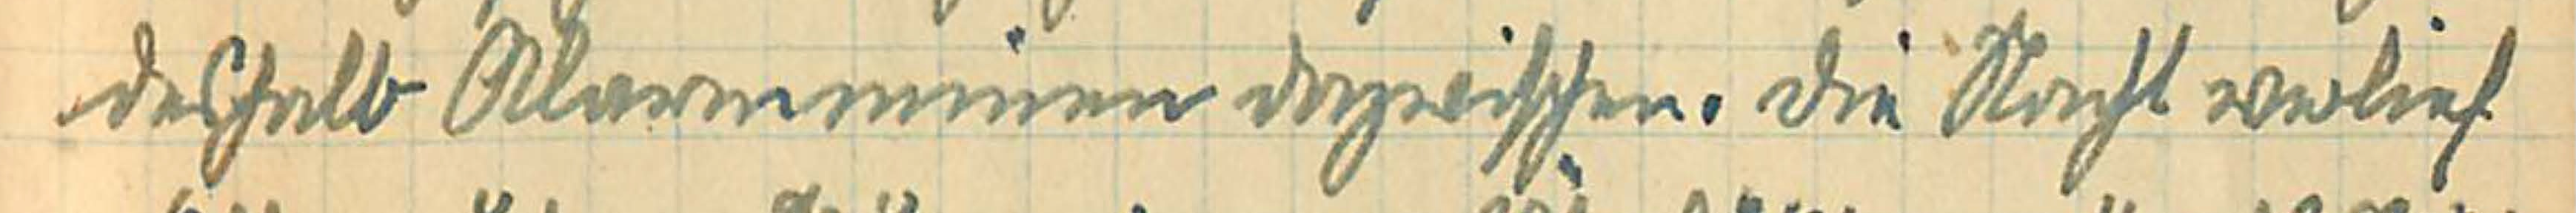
völlig ruhig. Nur ein paar Überläufer, erst als Späh-
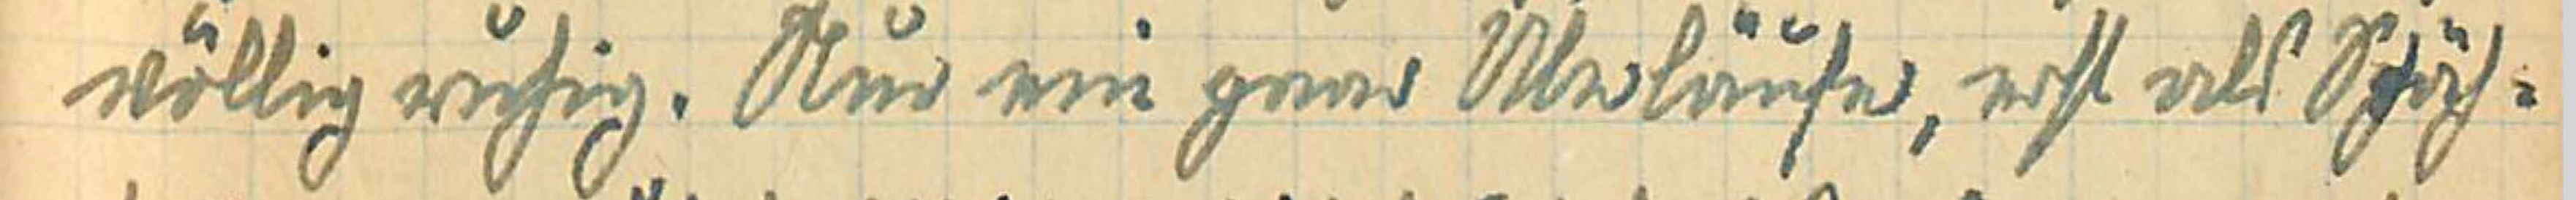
trupp vermutet schlichen sich durch das Gras u. zwar so
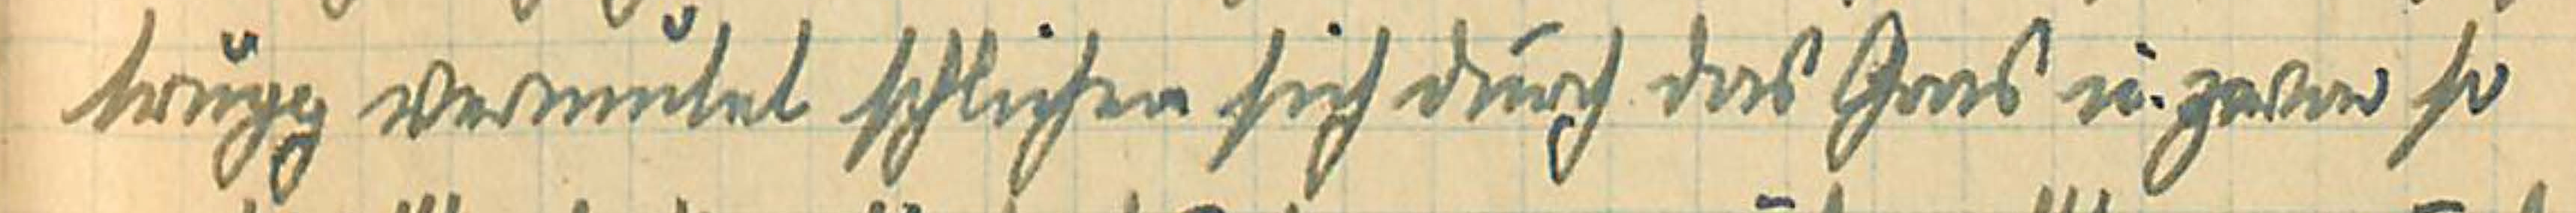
geschickt, daß erst dadurch man aufmerksam wurde,
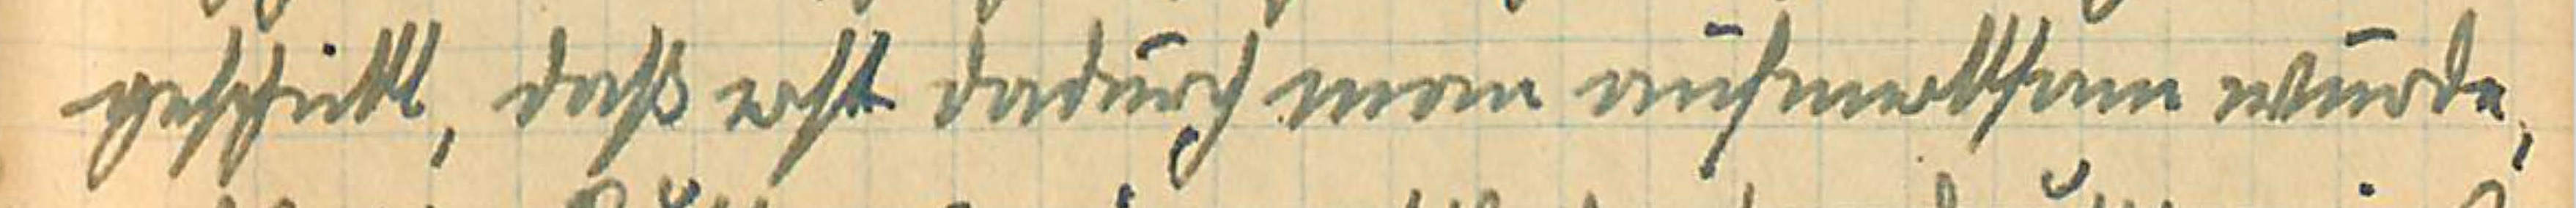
als ein Russe zu einem schlafenden Deutschen ins
